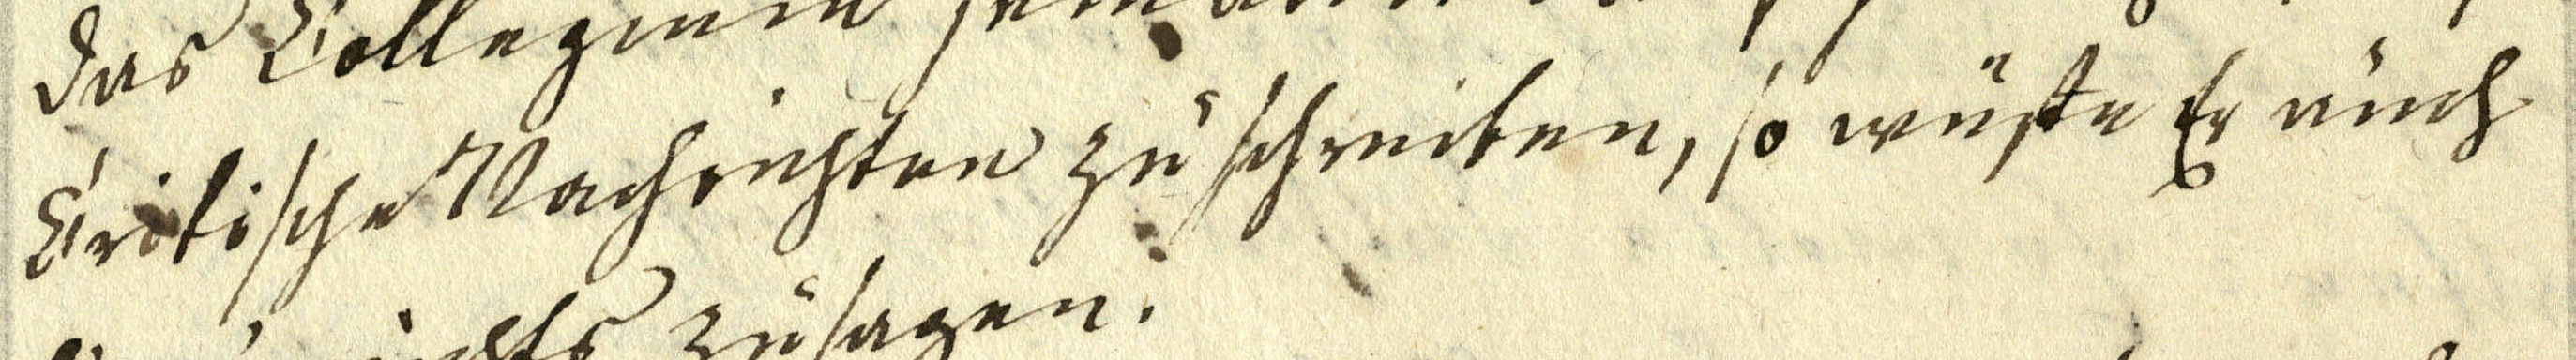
Critische Nachrichten zu schreiben, so wüßte Er auch
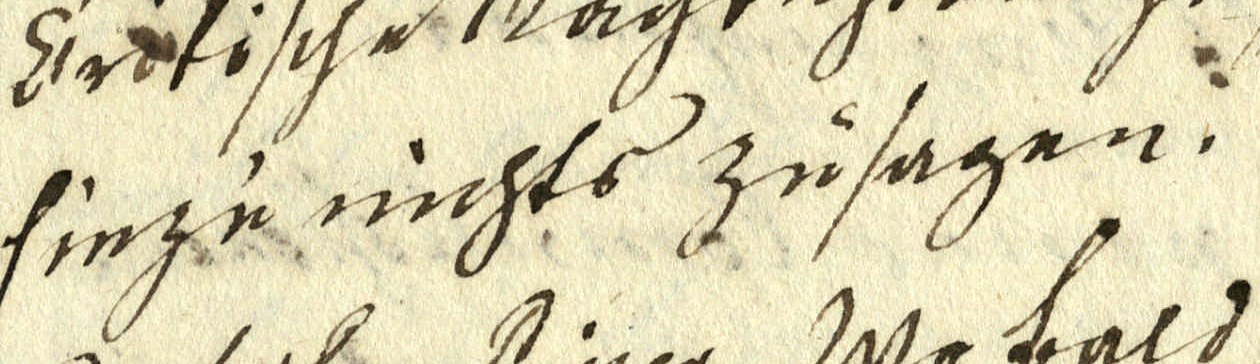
hiezu nichts zusagen.
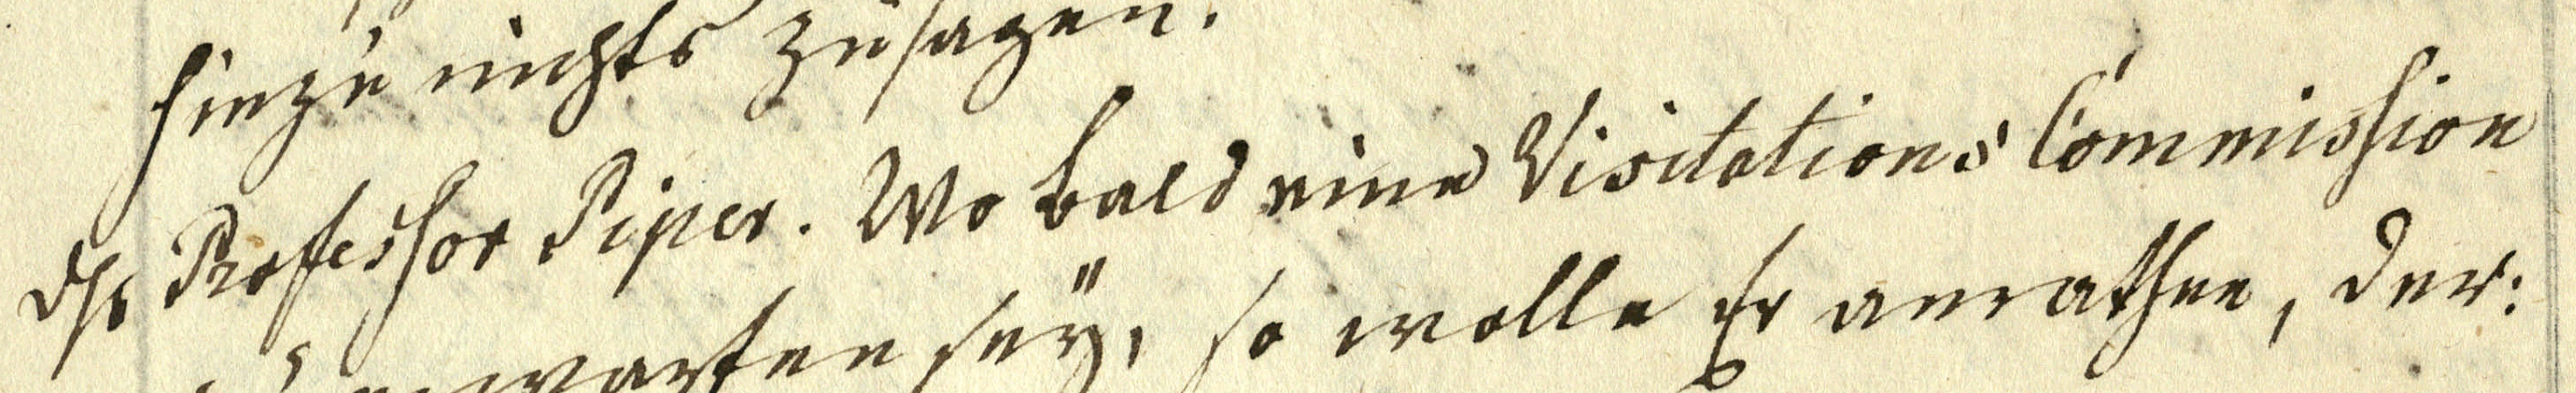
dh Professor Piper. Wo bald eine Visitations Commission
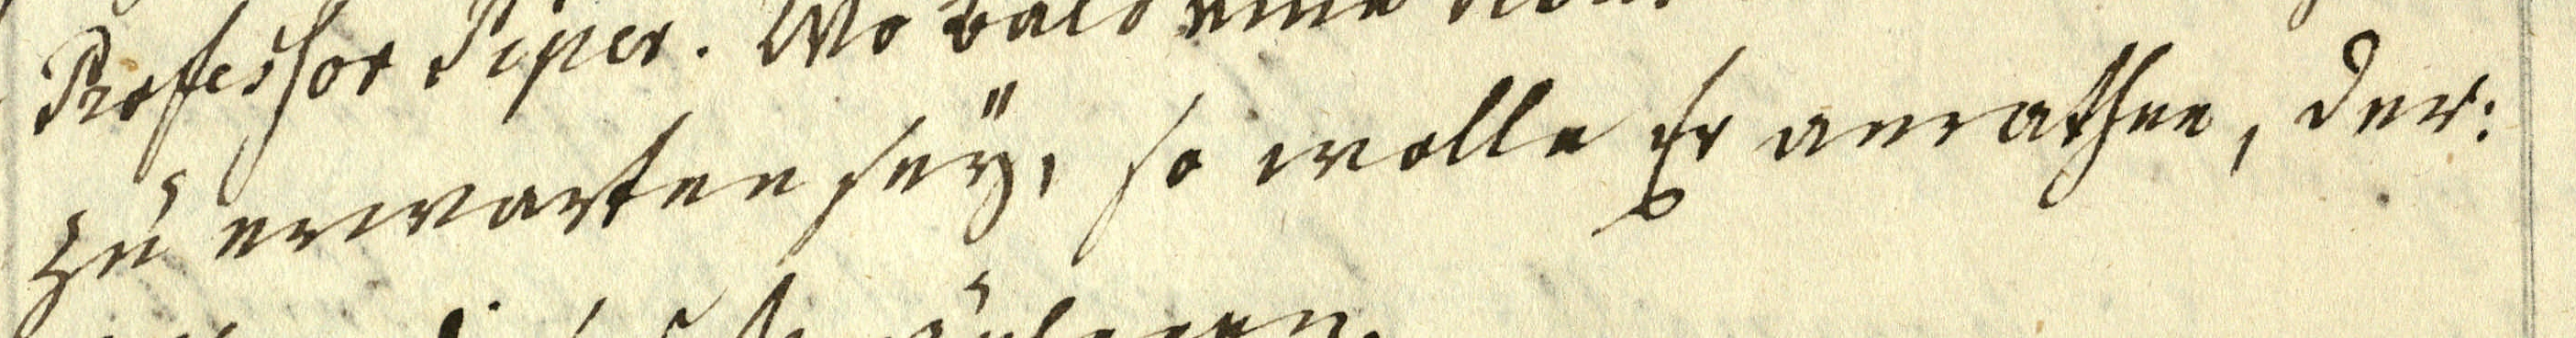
zu erwarten seÿ, so wolle Er anrathen, der¬
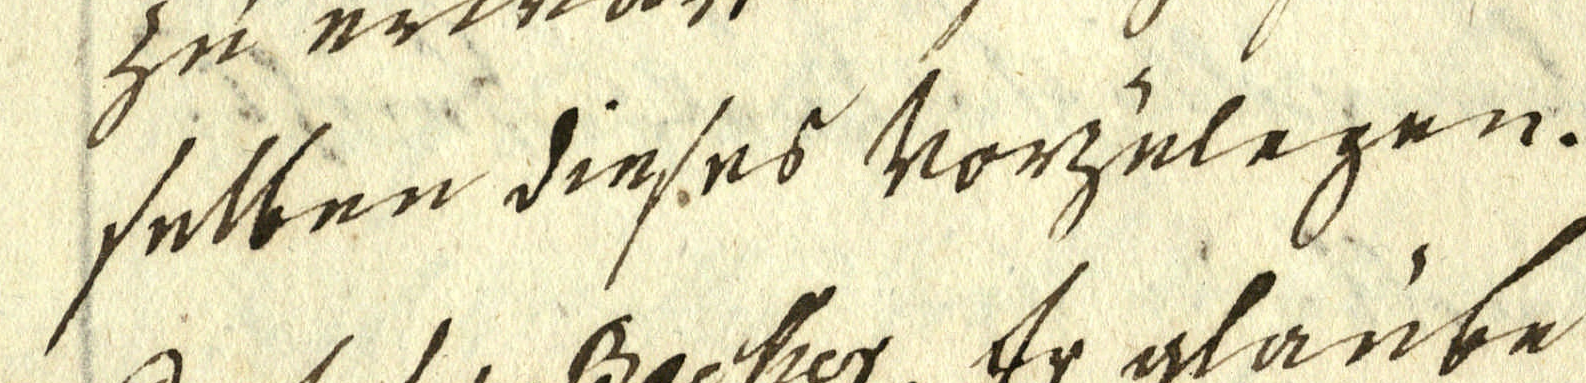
selben dieses vorzulegen.
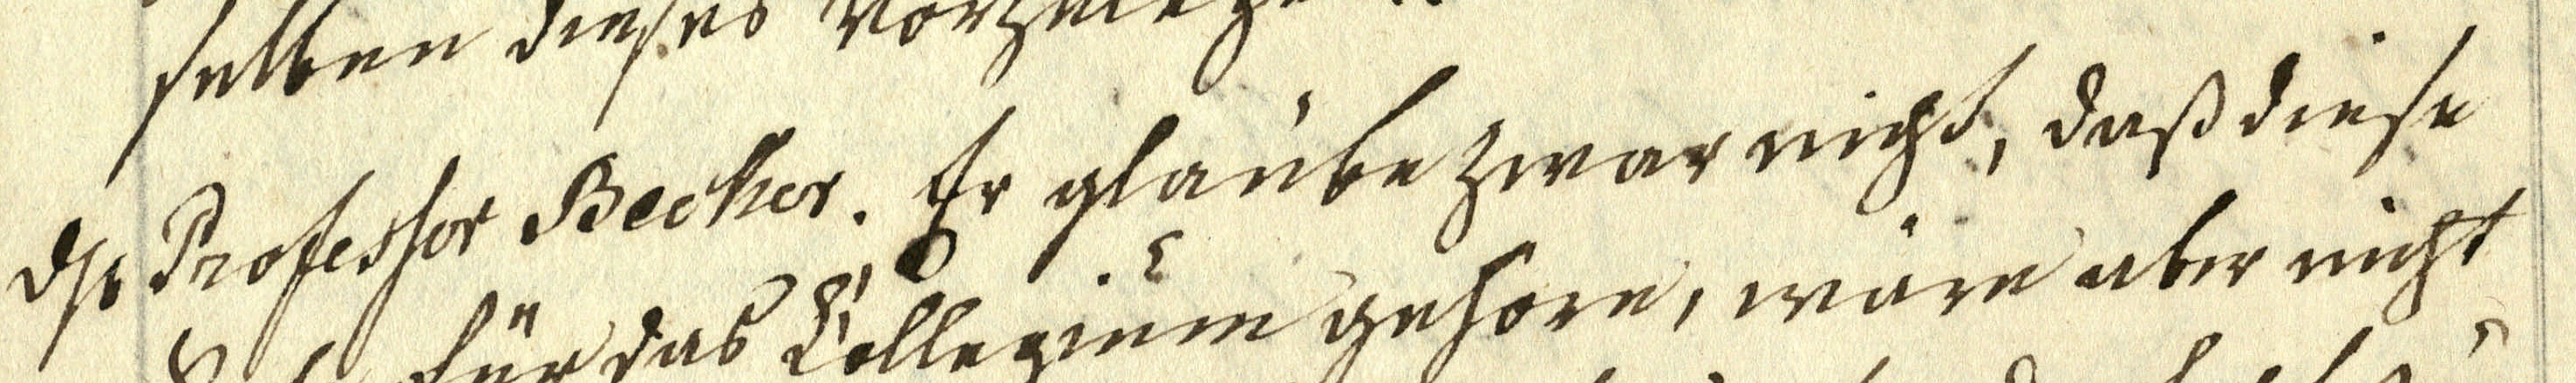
dh Professor Becker. Er glaube zwar nicht, daß diese
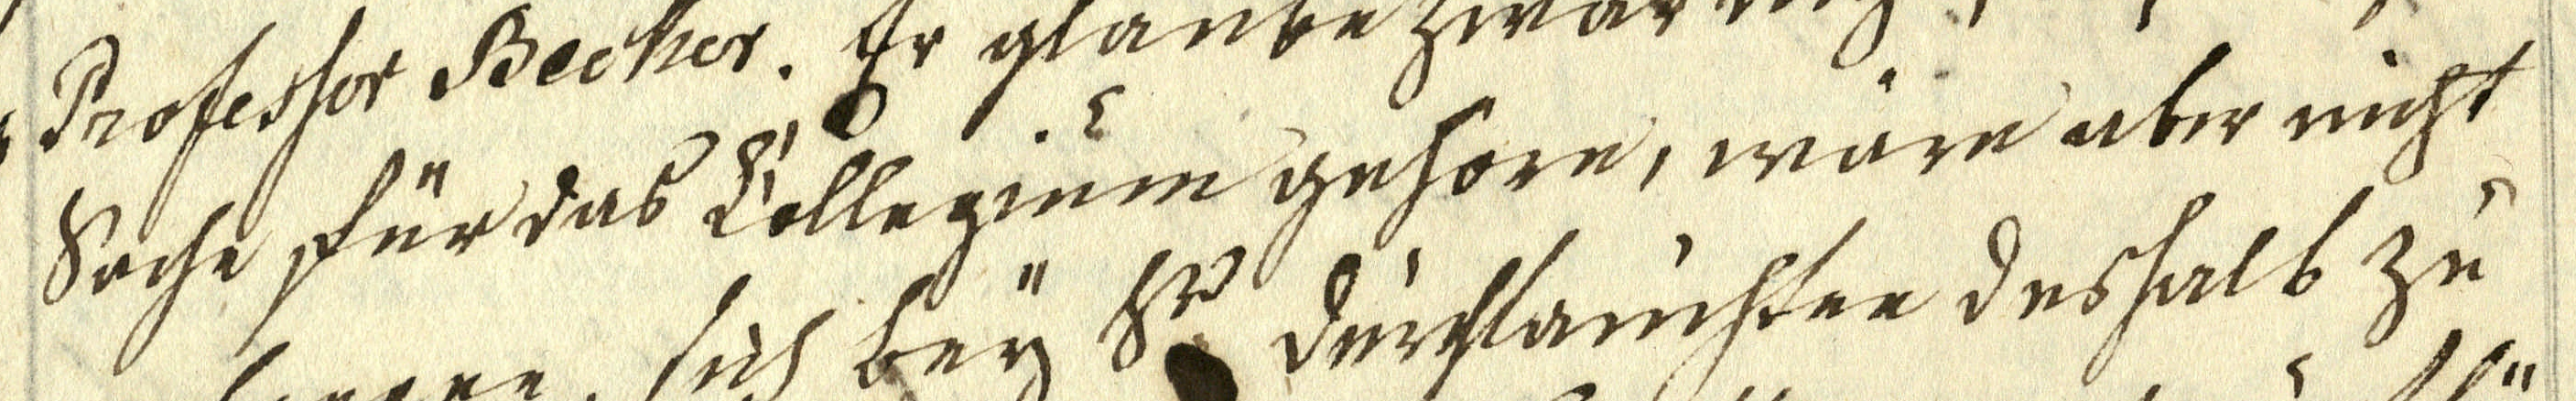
Sache für das Collegium gehöre, wäre aber nicht
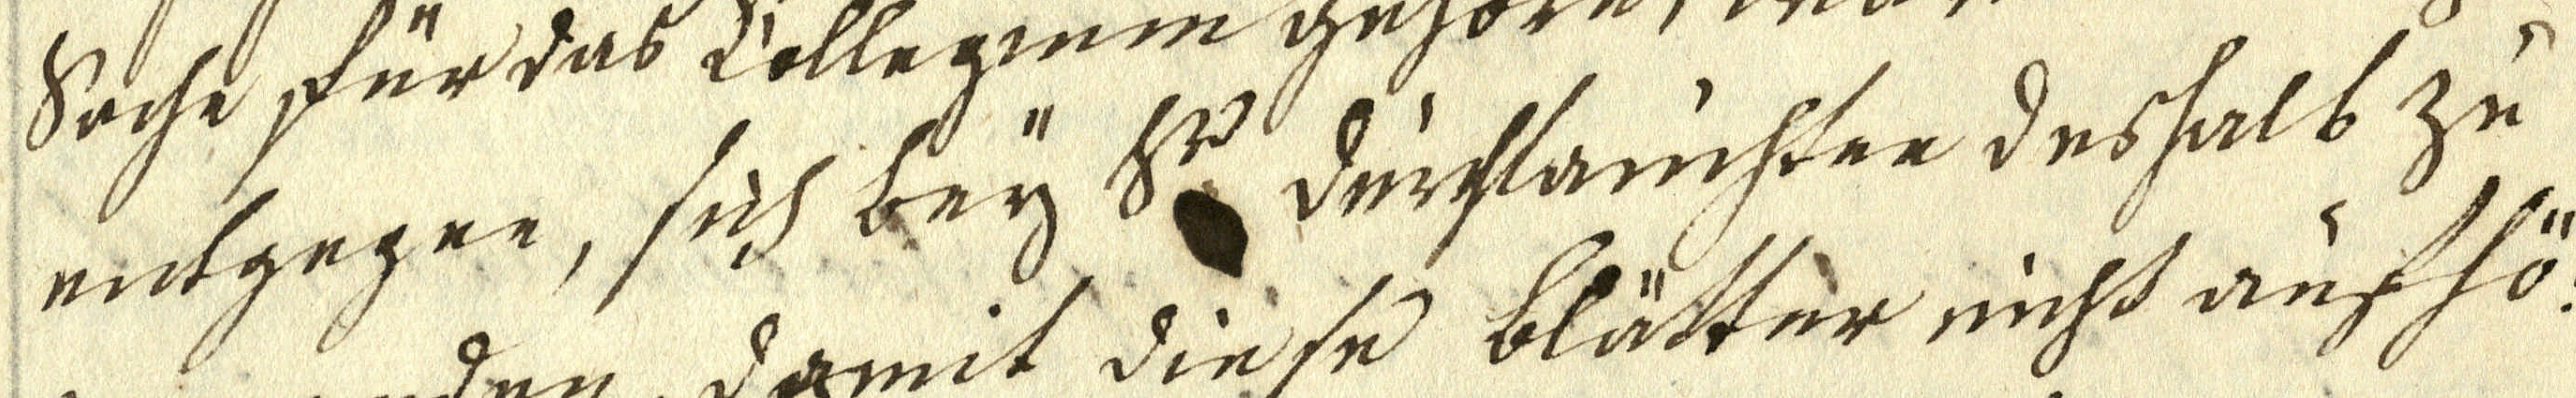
entgegen, sich beÿ Sr Durchlauchten deshalb zu
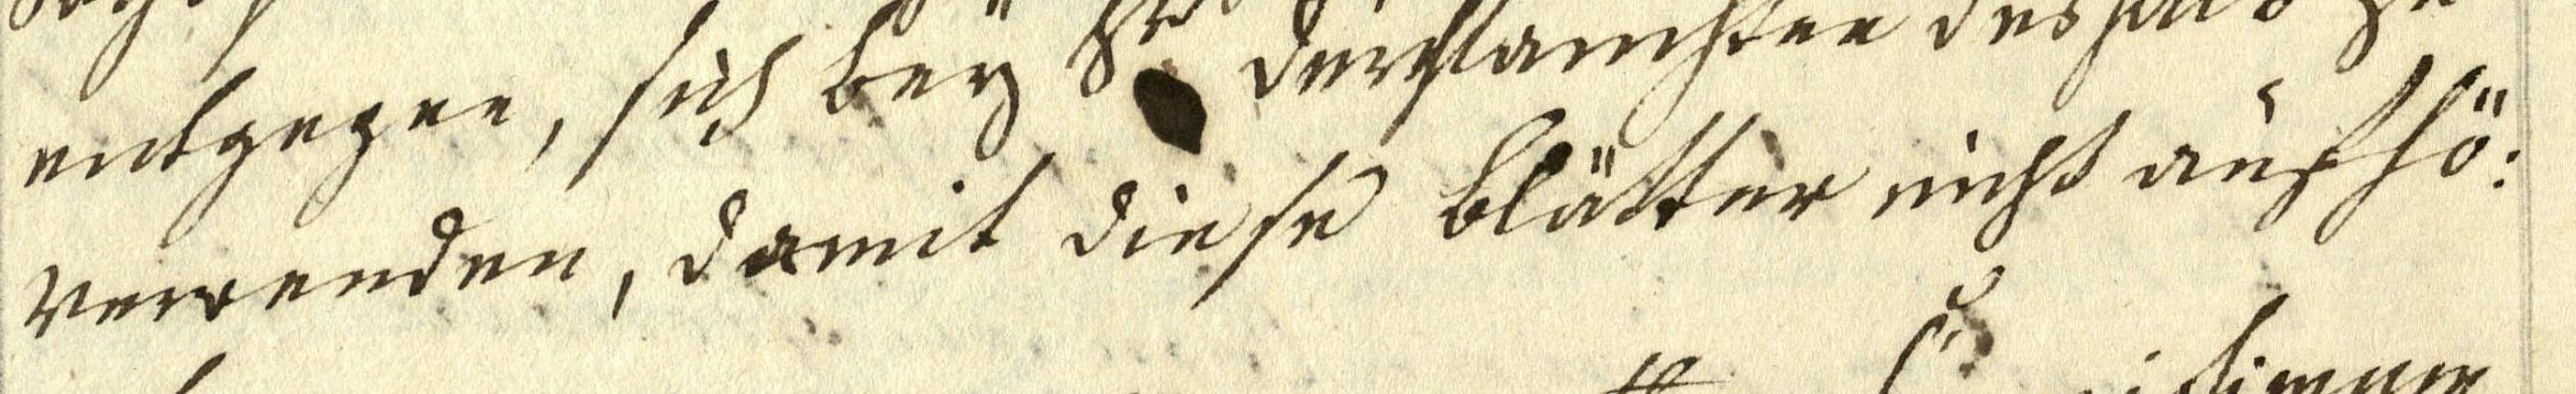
verwenden, damit die sie Blätter nicht aufhö¬
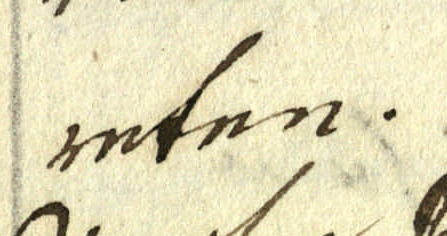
reten.
